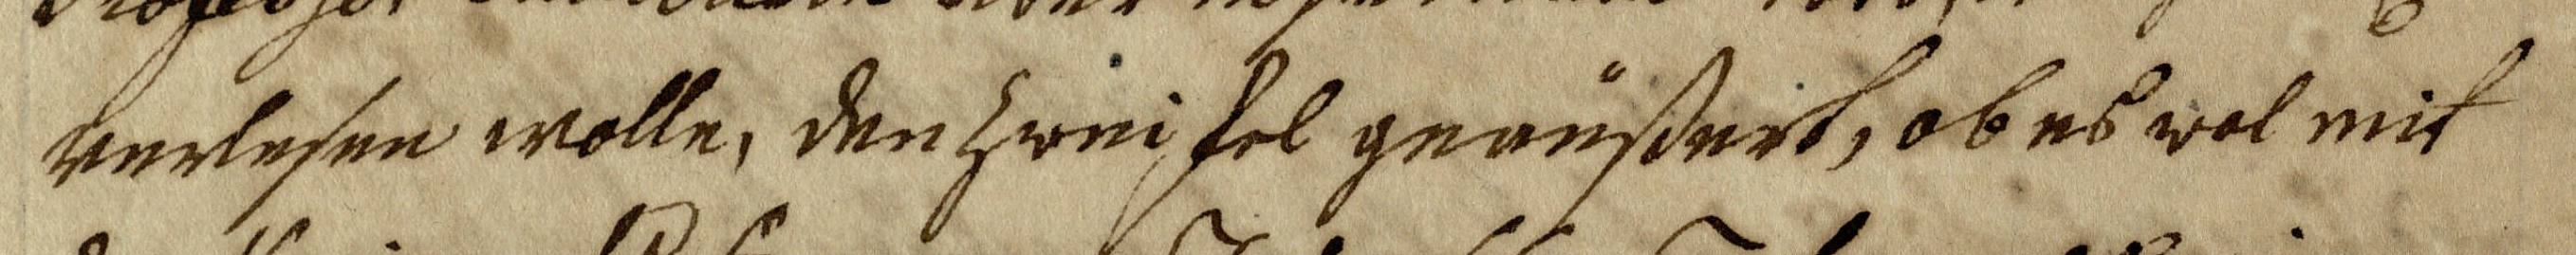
verlesen wolle, den Zweifel geäußert, ob es wol mit
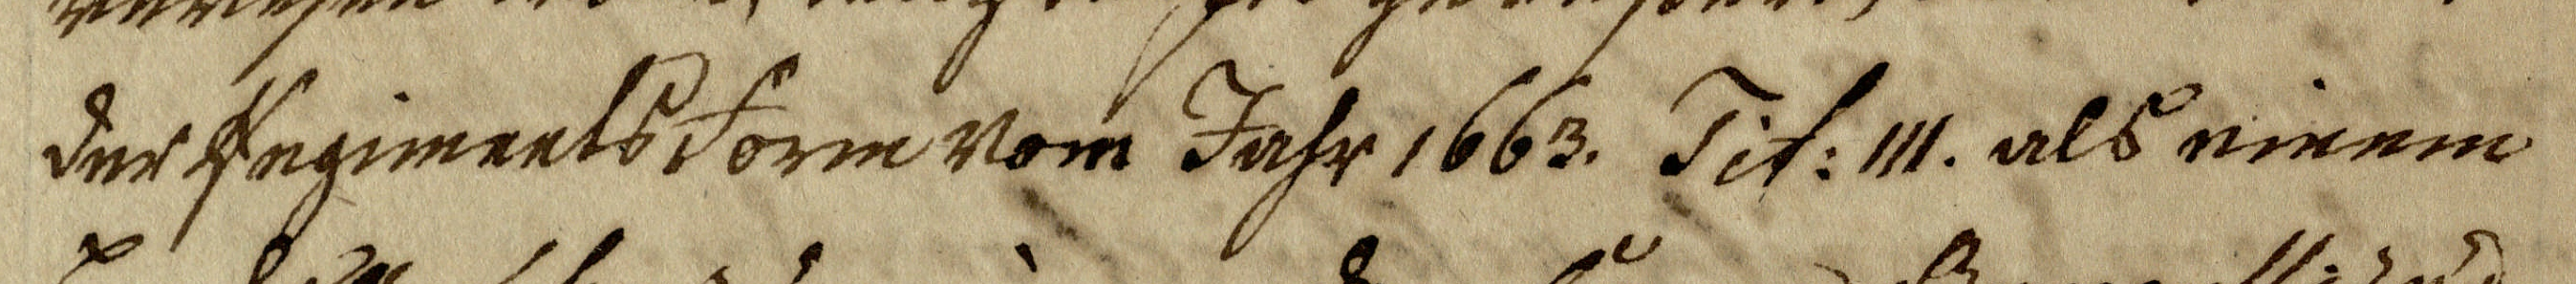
der Regiments Form vom Jahr 1663. Tit. III. als einem
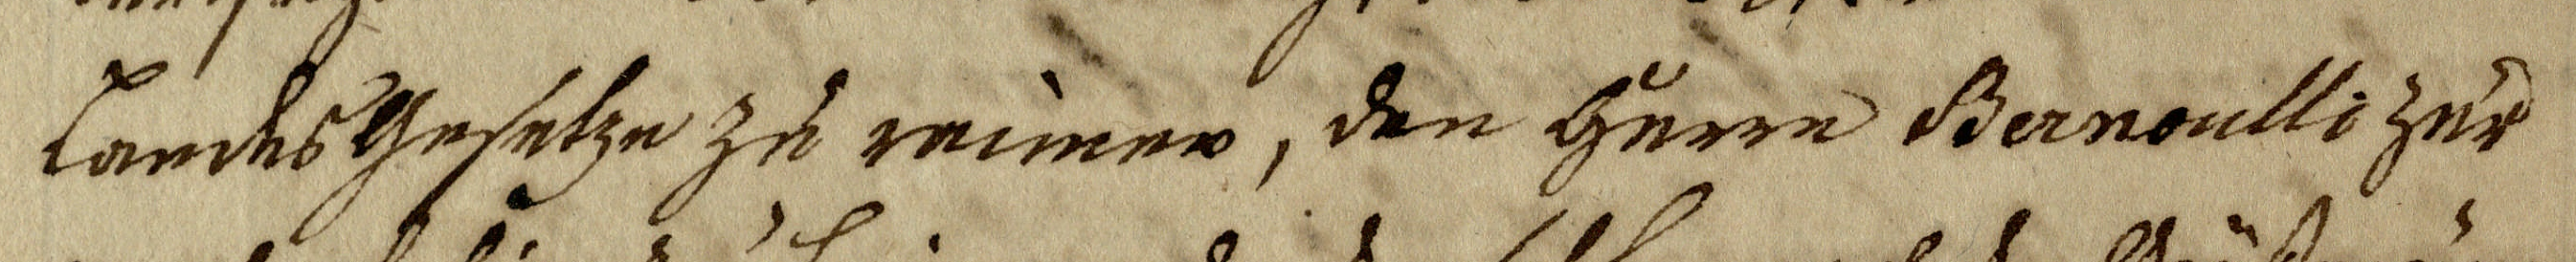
Landes Gesetze zu einen, den Herrn Bernoulli zur
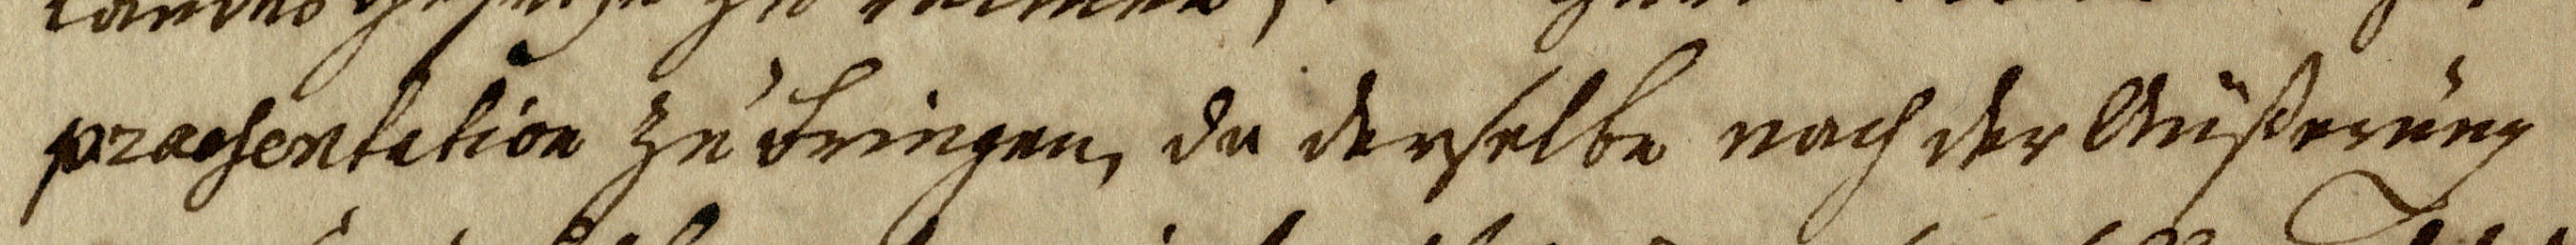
praesentation zu bringen, da derselbe nach der Äußerung
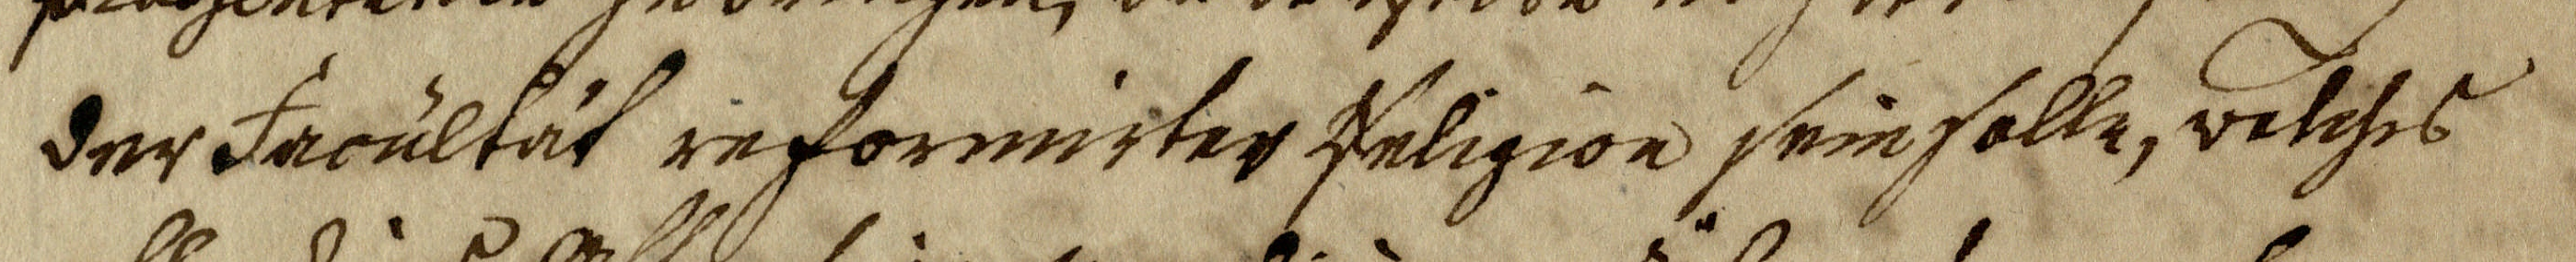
der Facultät reformierter Religion sein solte, welches
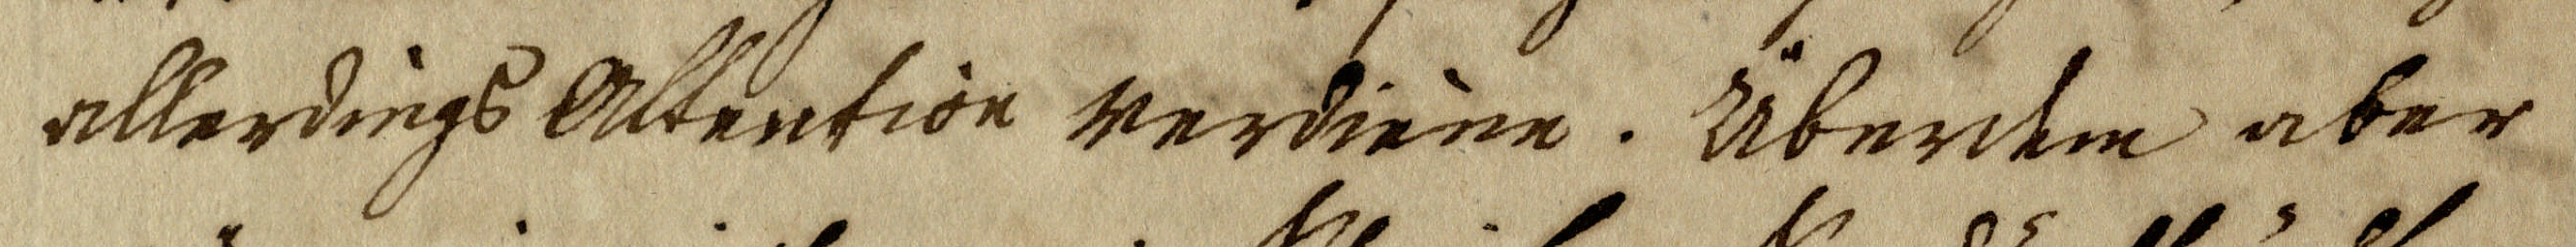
allerdings Attention verdiene. Überdem aber
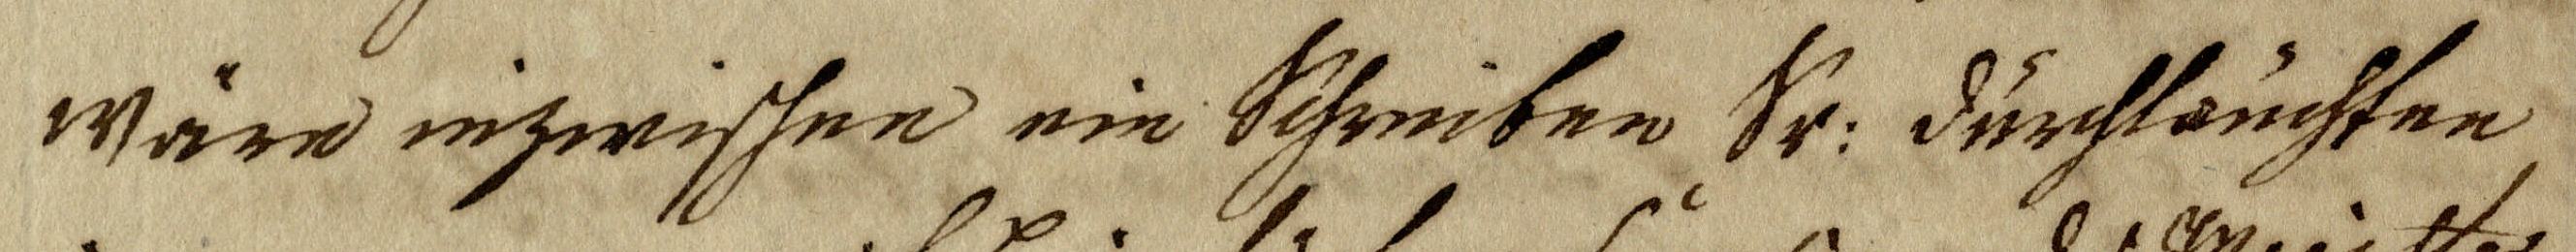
wäre inzwischen ein Schreiben Sr. Durchlauchten
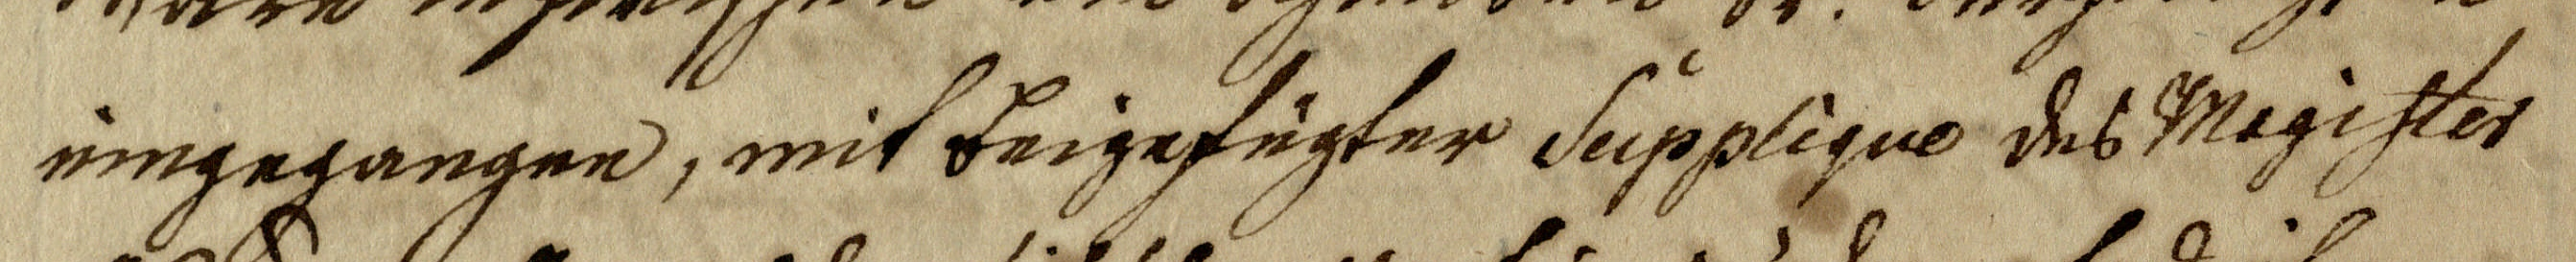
eingegangen, mit beigefügter Supplique des Magister
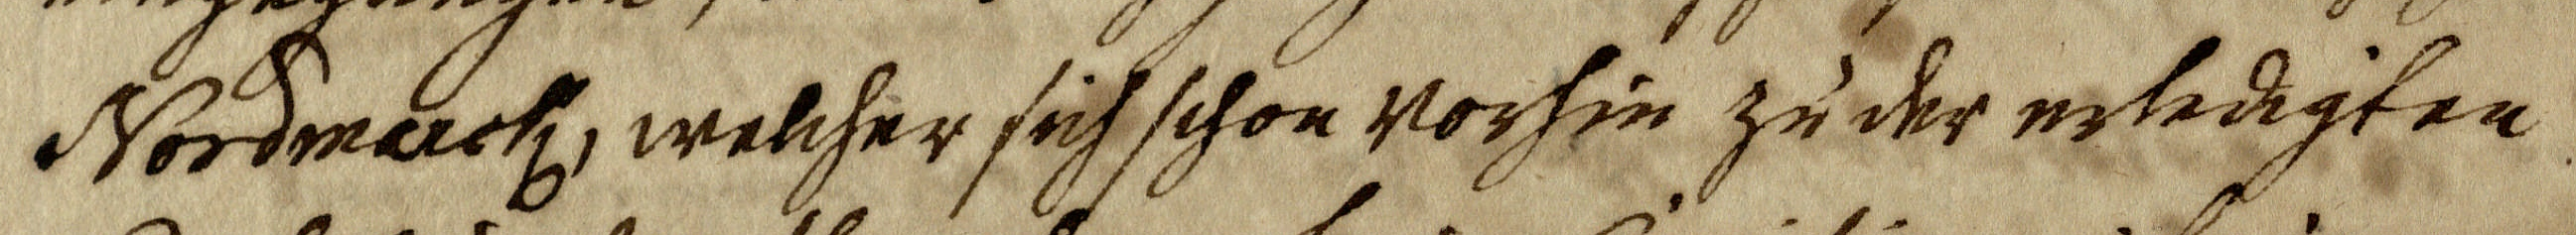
Nordmarck, welcher sich schon vorhin zu der erledigten
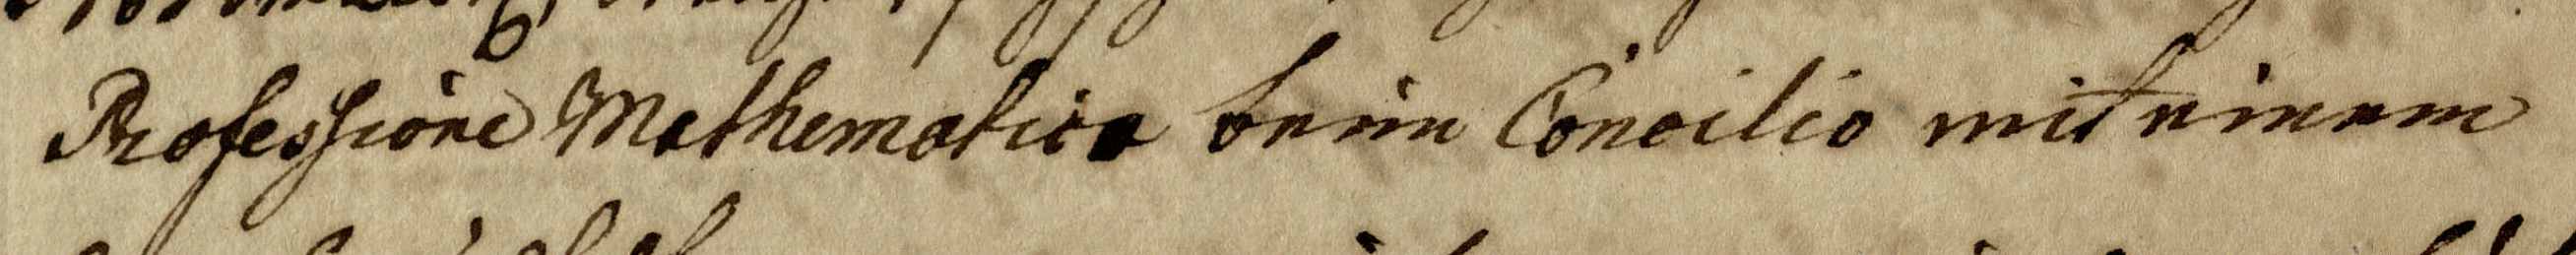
Professione Mathematica beim Concilio mit einem
